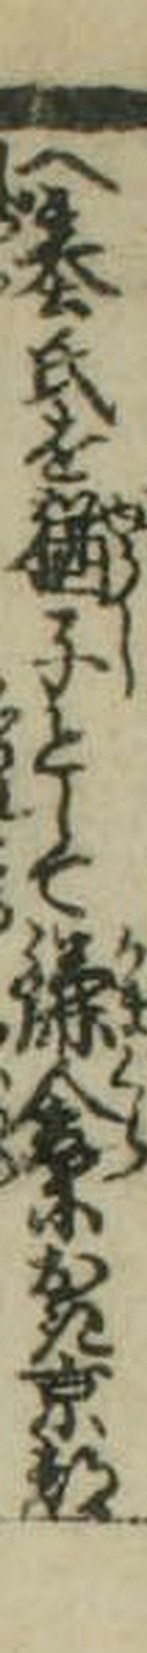へ基氏を猶子として鎌倉におき京都
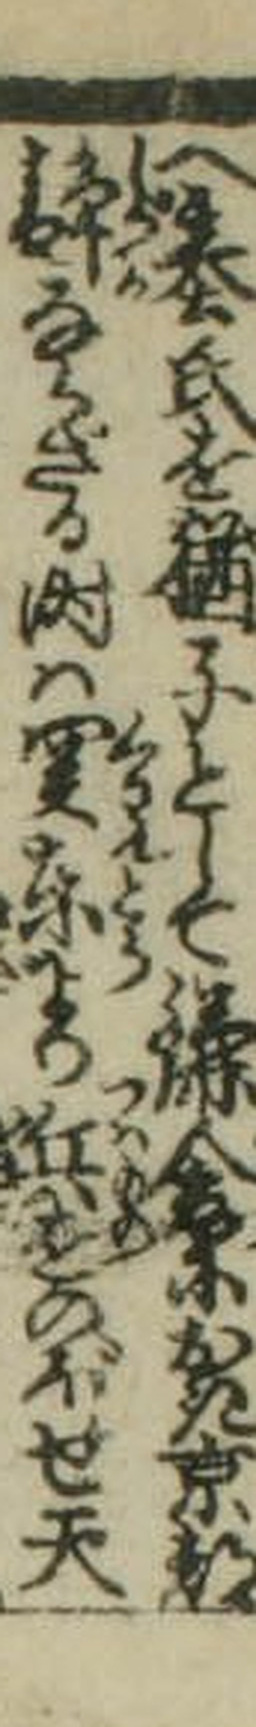静ならざる時は関東より兵をのぼせ天
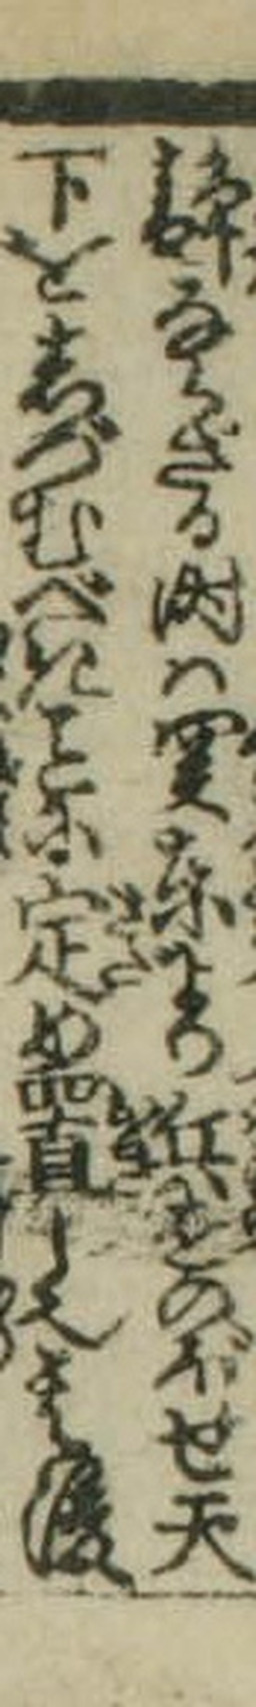下をしづむべきことに定め置し也其後
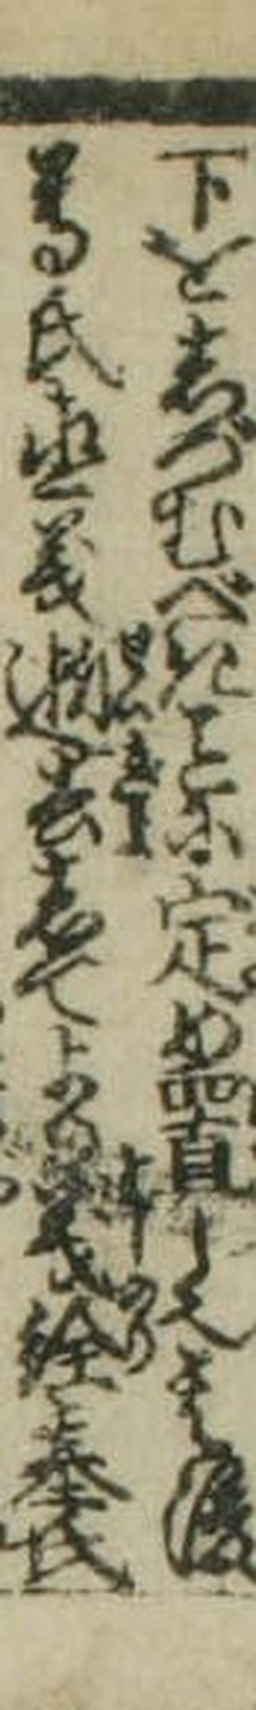尊氏直義逝去してより義詮基氏
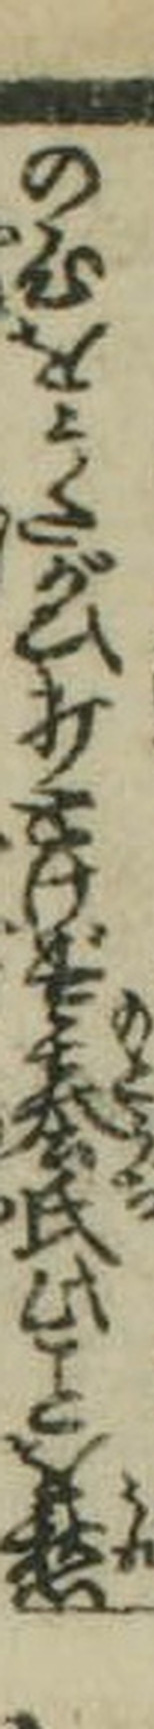の心をうたがひ打とけず基氏此ことを愁
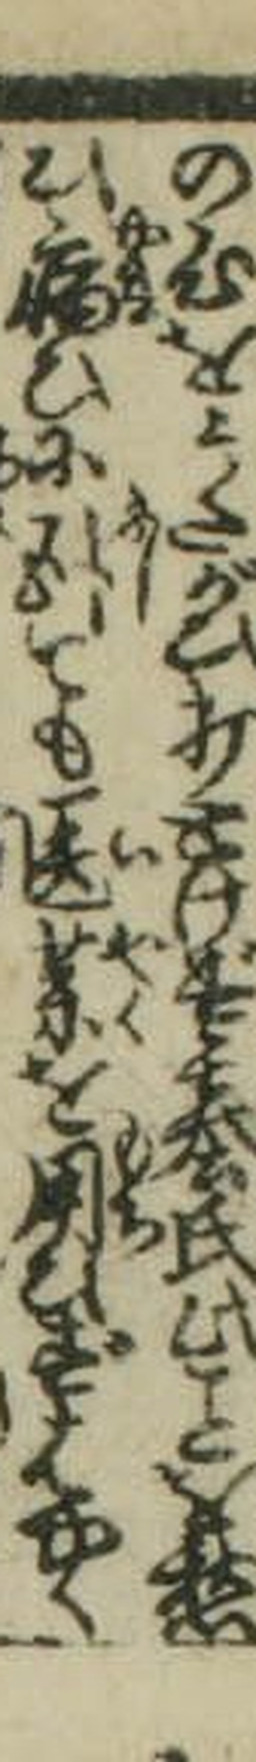ひ病ひに臥ても医薬を用ひずはやく
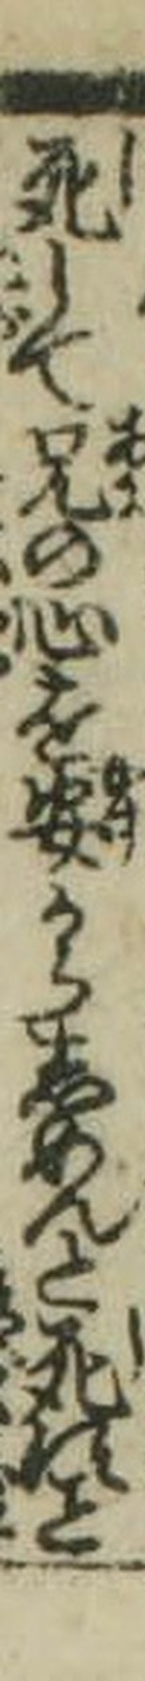死して兄の心を安からしめんと死すこと
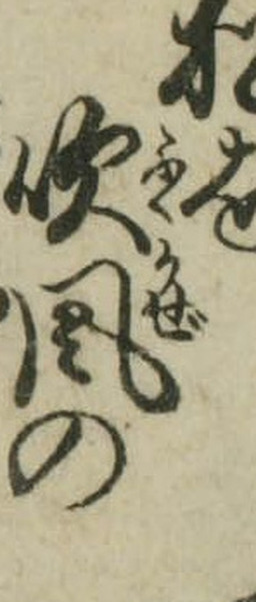吹風の
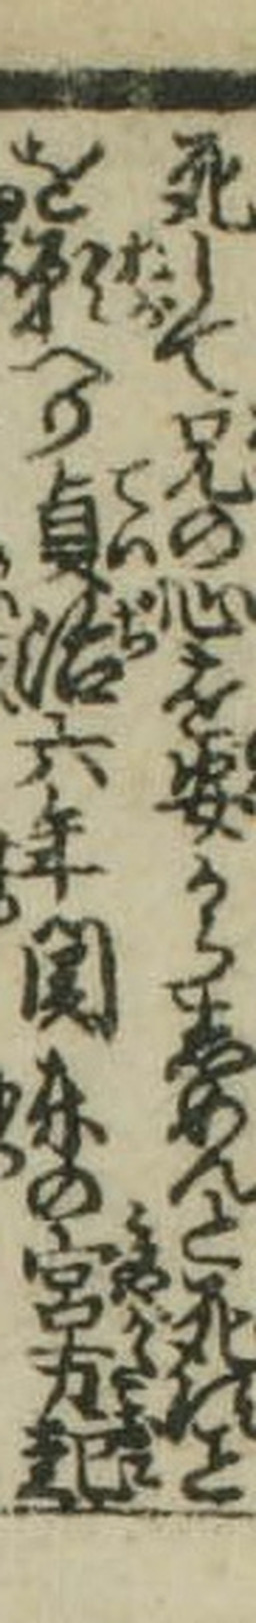を願へり貞治六年関東の宮方起
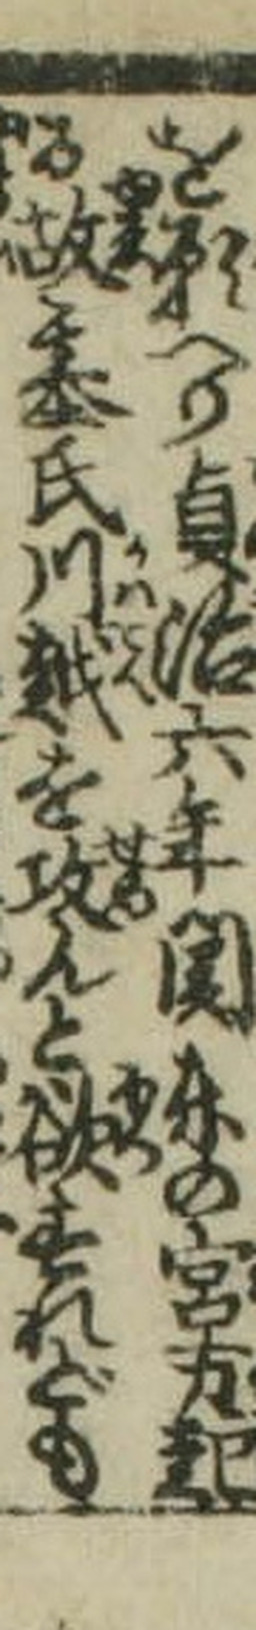る故基氏川越を攻んと欲すれども
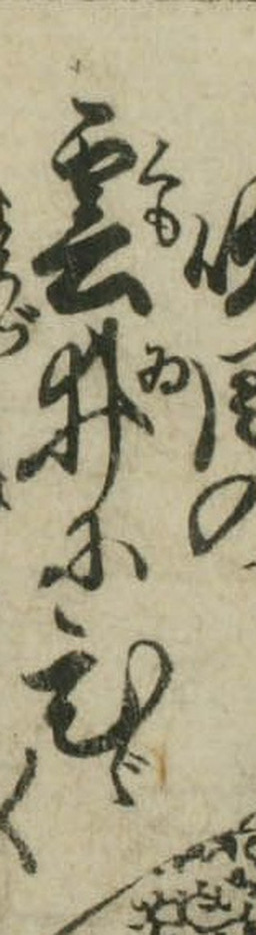雲井にひゞく
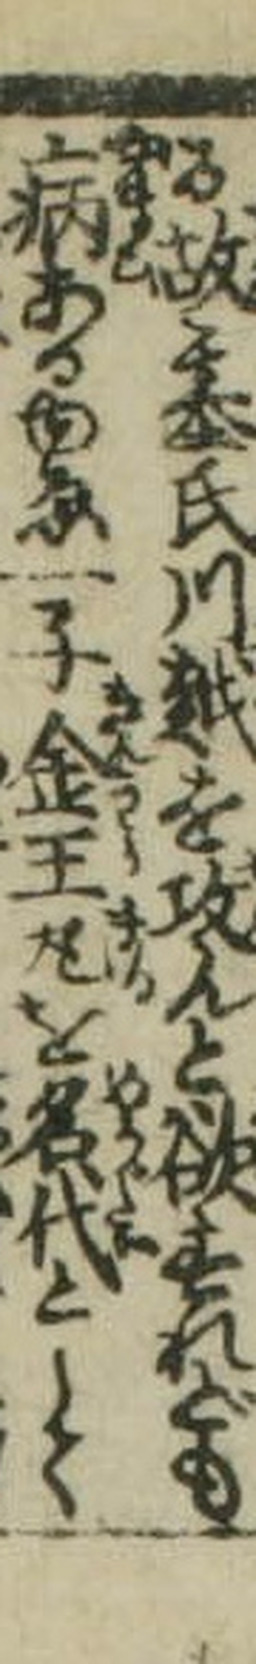病あるゆゑ一子金王丸を名代として
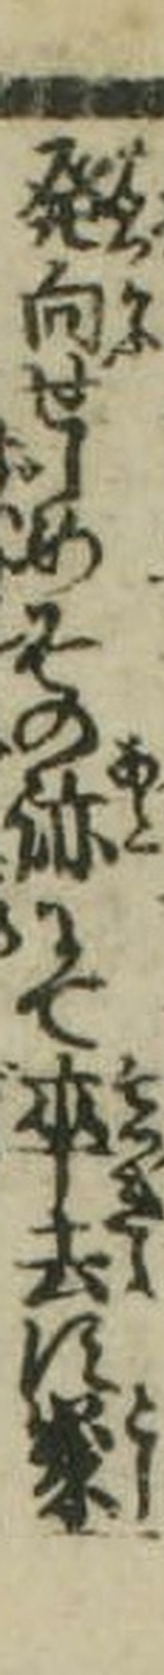発向せしめその跡にて卒去す歳
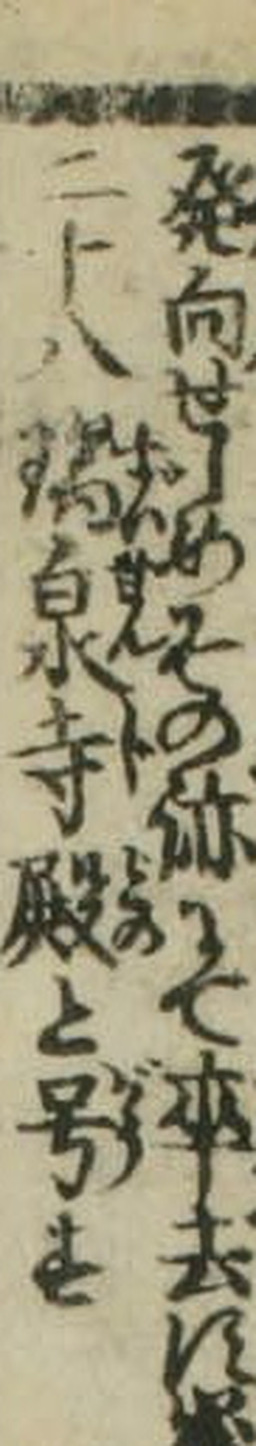二十八瑞泉寺殿と号す
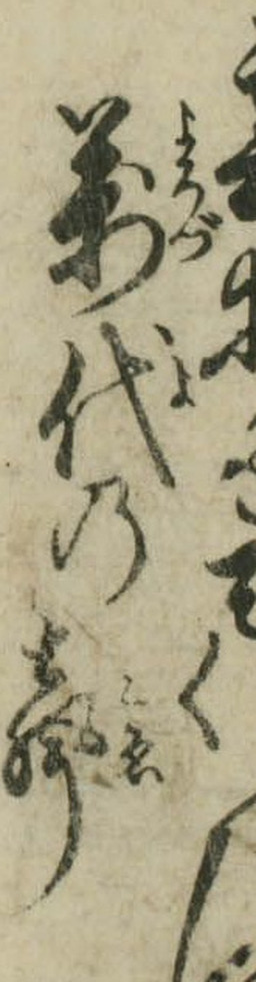万代の声
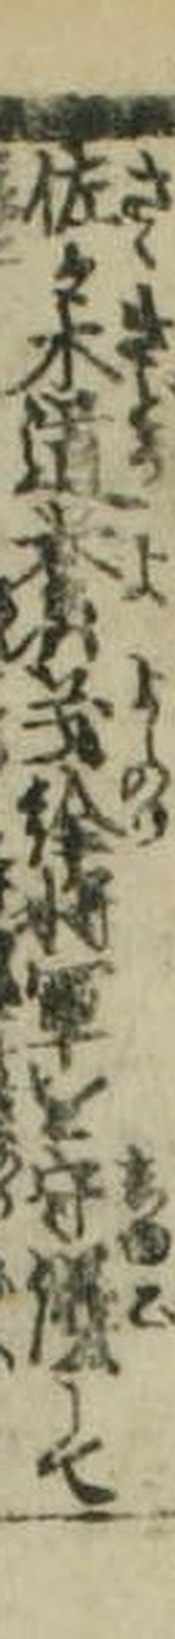佐々木道誉義詮将軍を守護して
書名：續英雄百人一首
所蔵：東京学芸大学附属図書館
